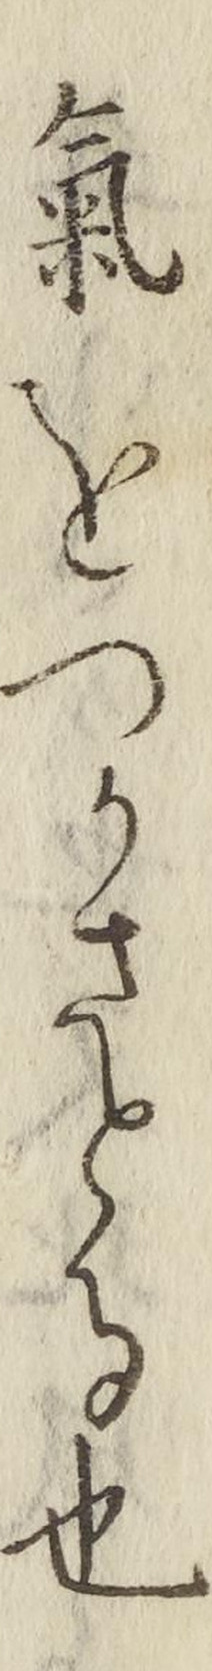気をつかさとる也
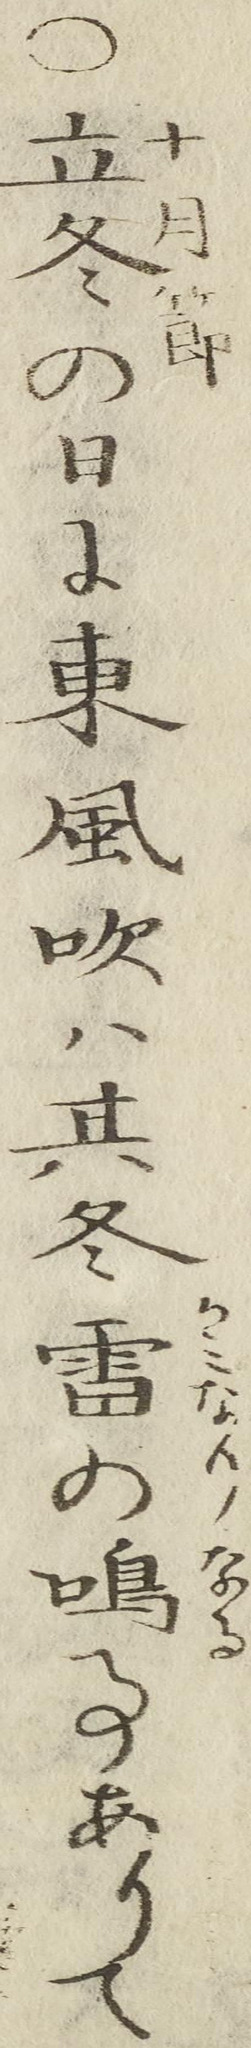〇立冬の日に東風吹は其冬雷の鳴事ありて
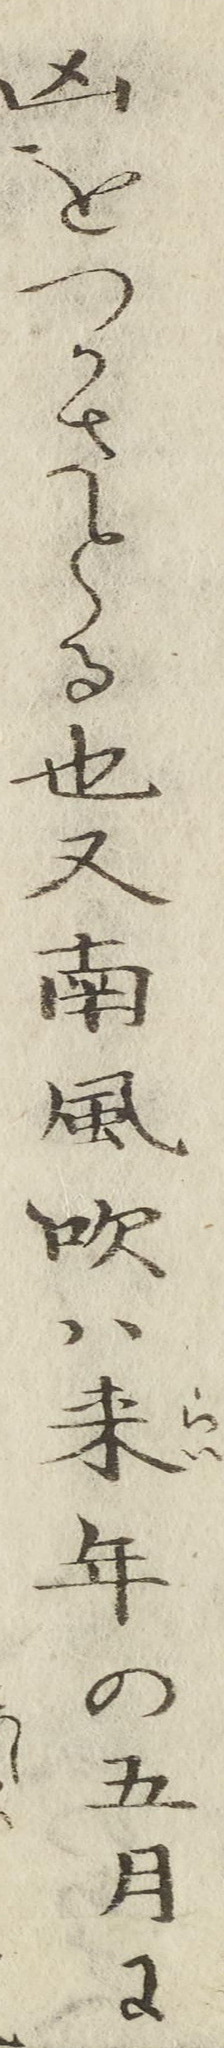凶をつかさとる也又南風吹は来年の五月に
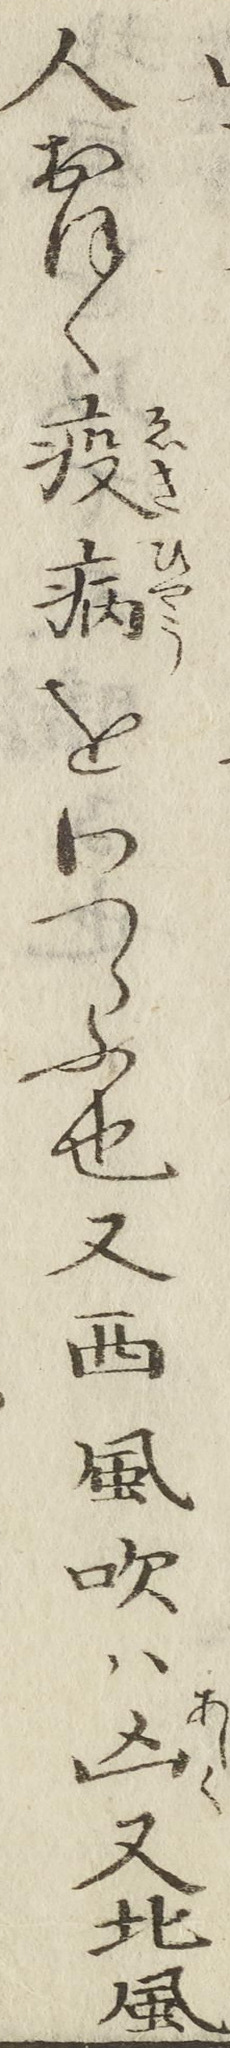人おほく疫病をわつらふ也又西風吹は凶又北風
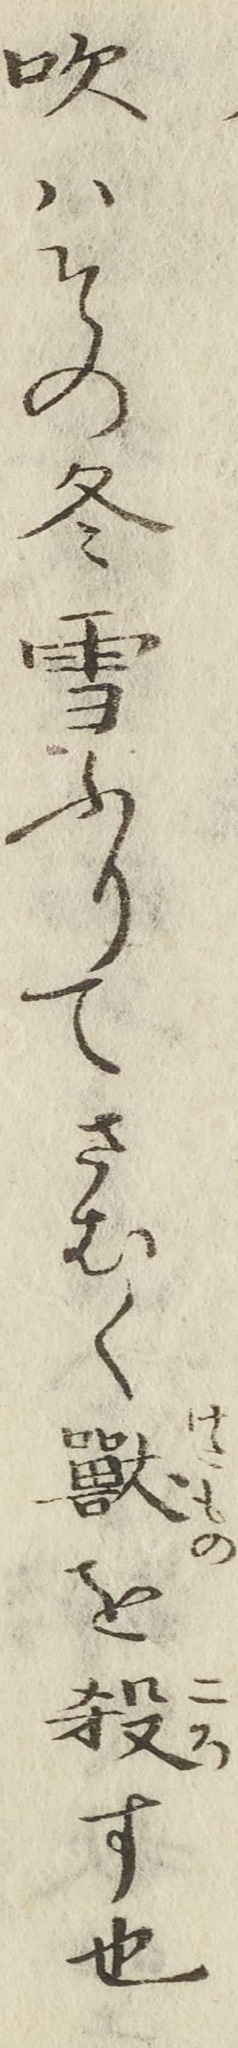吹はその冬雪ふりてさむく獣を殺す也
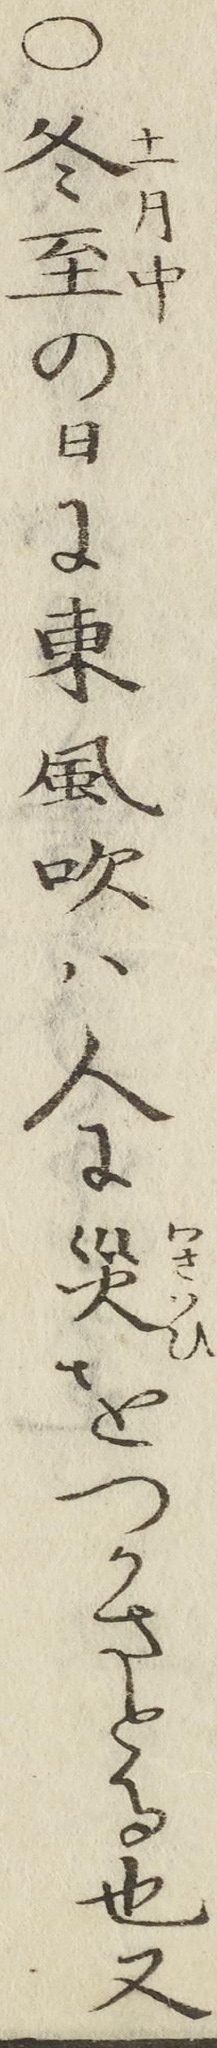〇冬至の日に東風吹は人に災をつかさとる也又
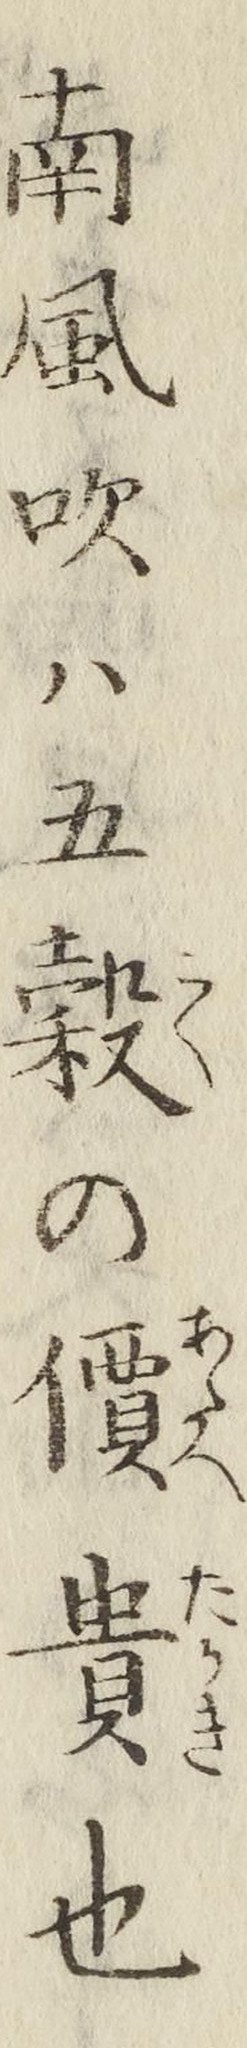南風吹は五穀の価貴也
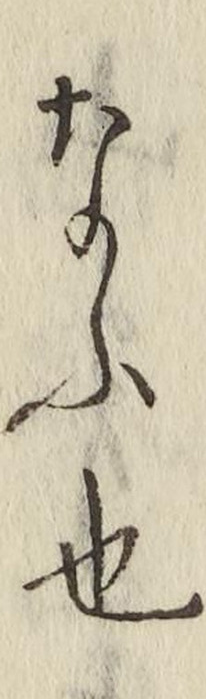なふ也
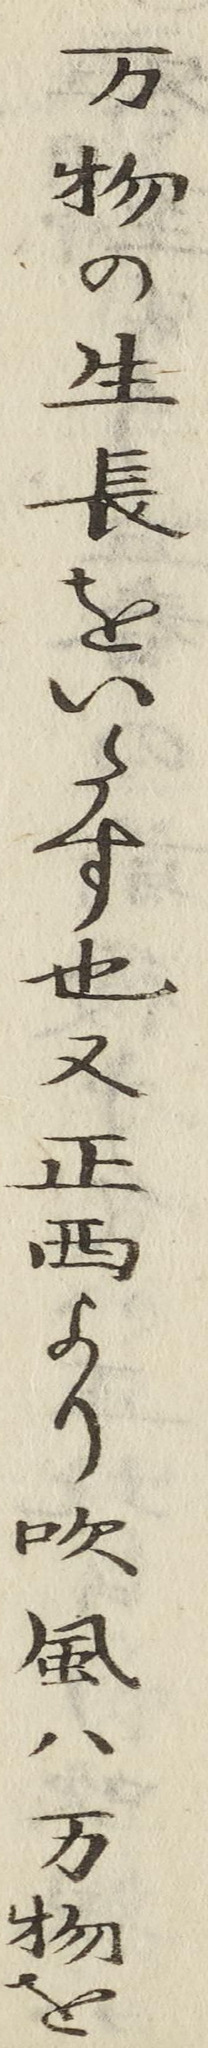万物の生長をたす也又正西より吹風は万物を
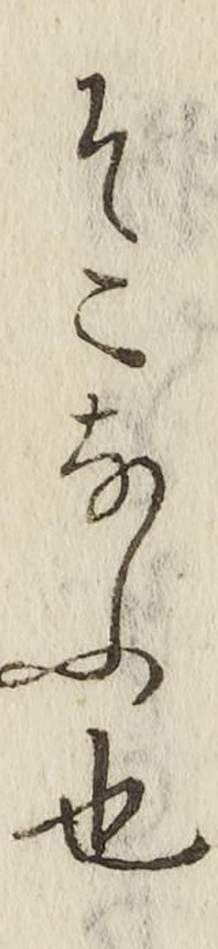そこなふ也
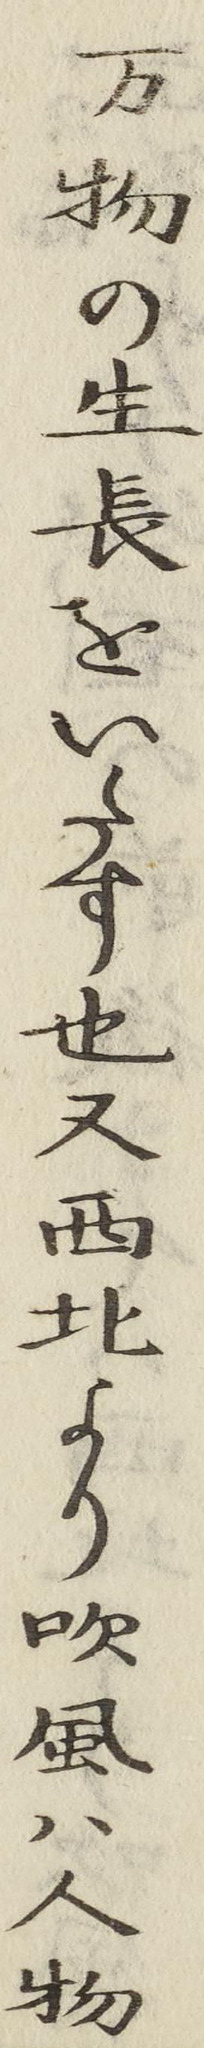万物の生長をたす也又正北より吹風は人物
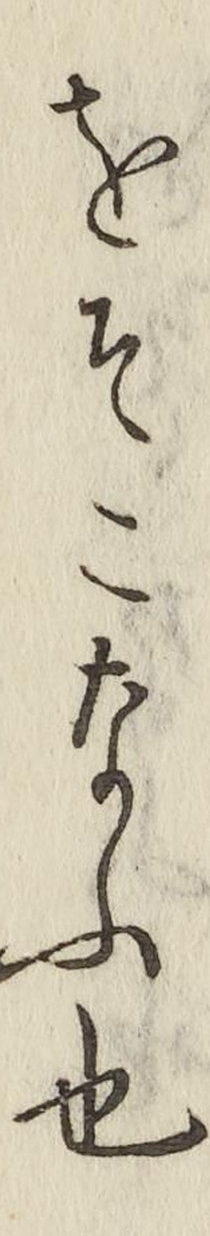をそこなふ也
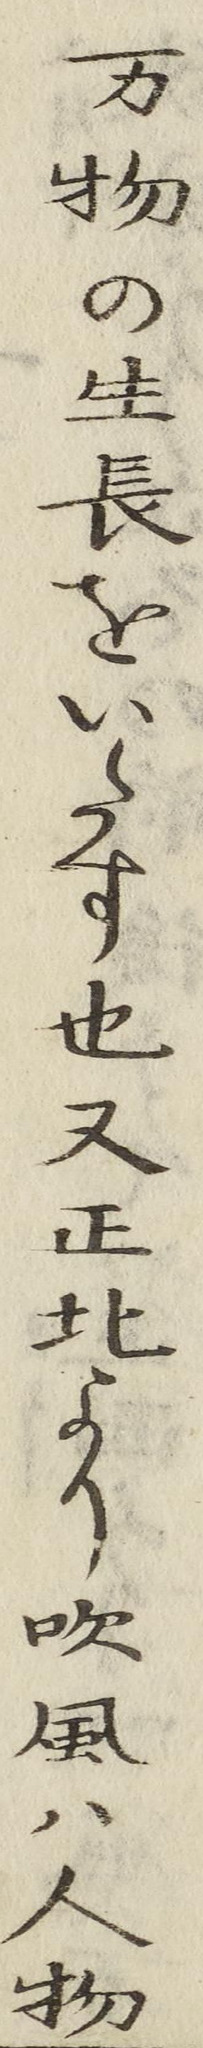万物の生長をたす也又正北より吹風は人物
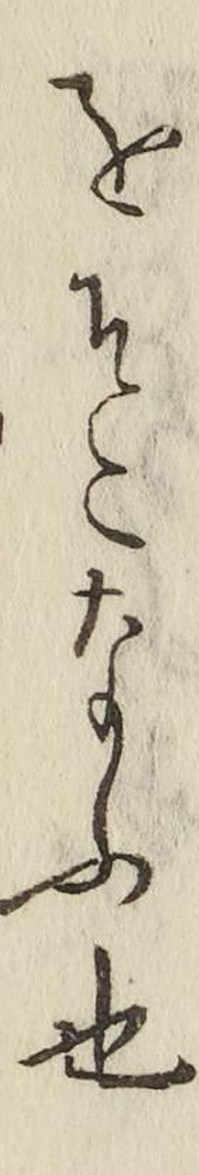をそこなふ也

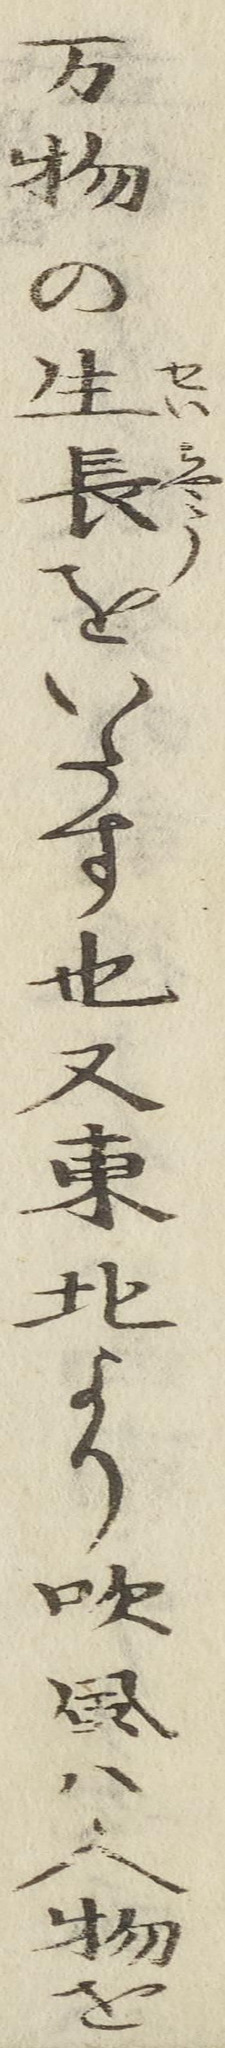万物の生長をいたす也又東北より吹風は人物を
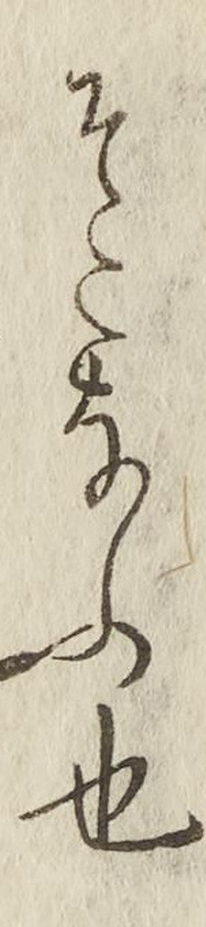そこなふ也
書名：天時占候　二
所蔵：東京大学地震研究所図書室 Earthquake Research Institute Library, The University of Tokyo, JAPAN
